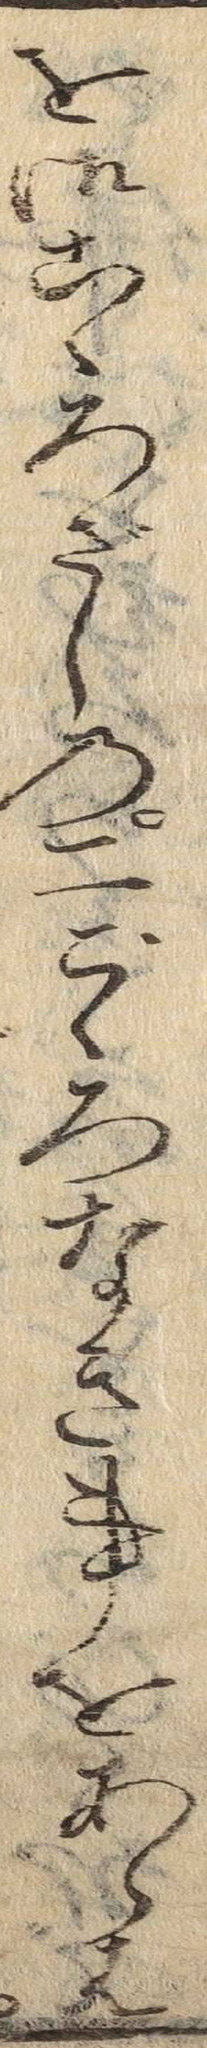を御こゝろざしの。二ごゝろなき事をあらは
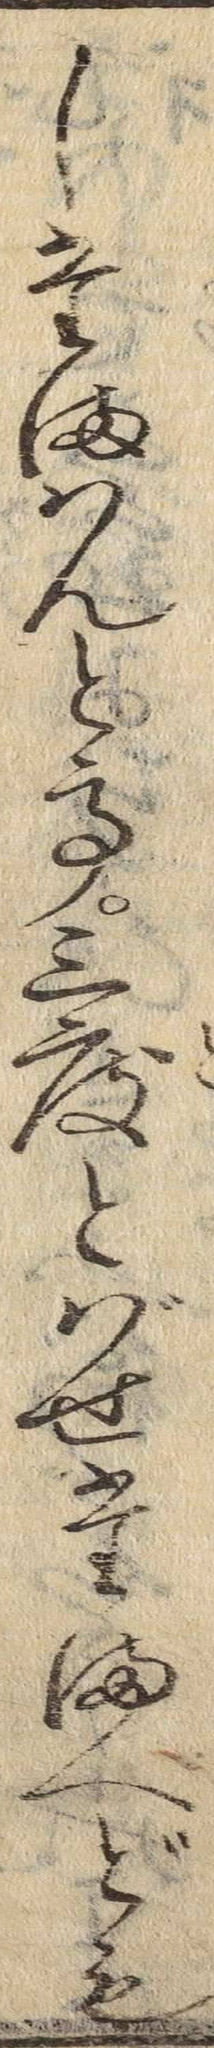したまはんとて。三度とばせたまへども。
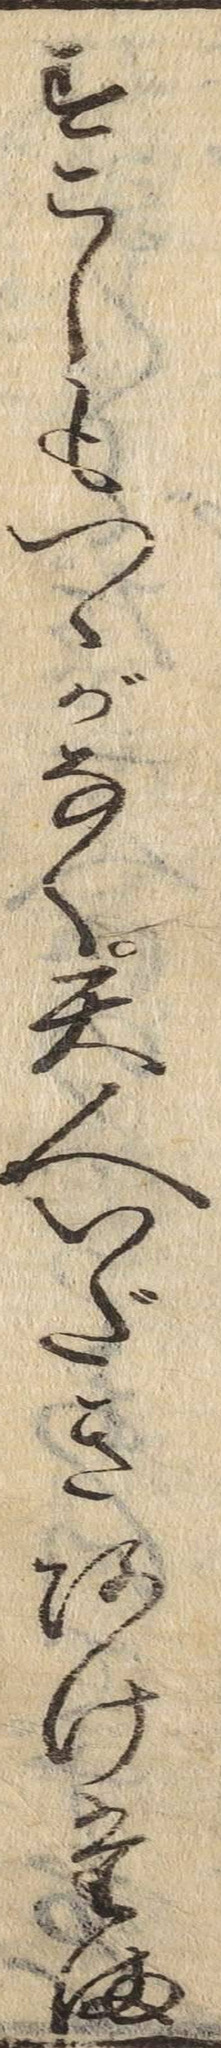すこしもつゝがなく。天人いだきあけたま
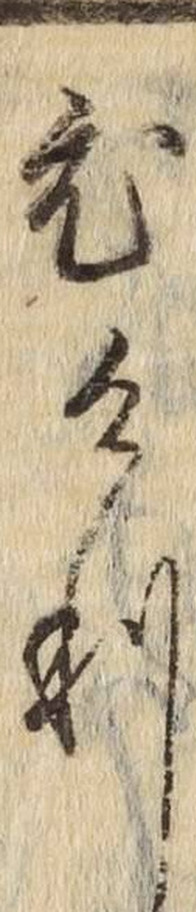ひけり

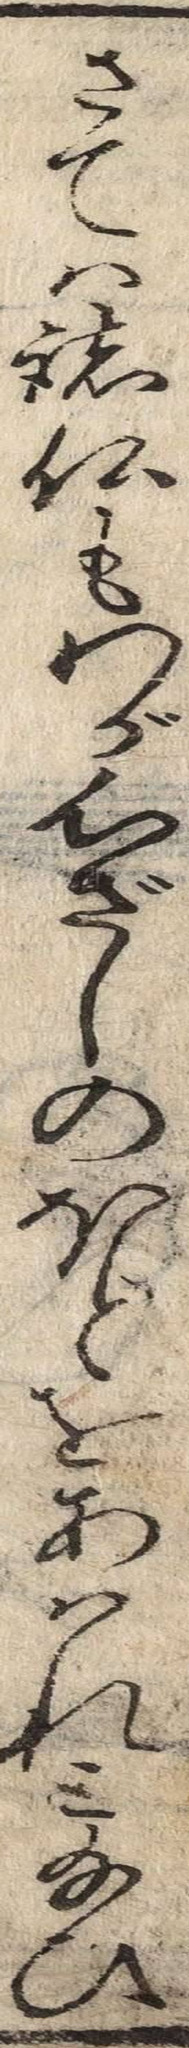さては諸仏もわが心ざしのほどをあはれみ給ひ
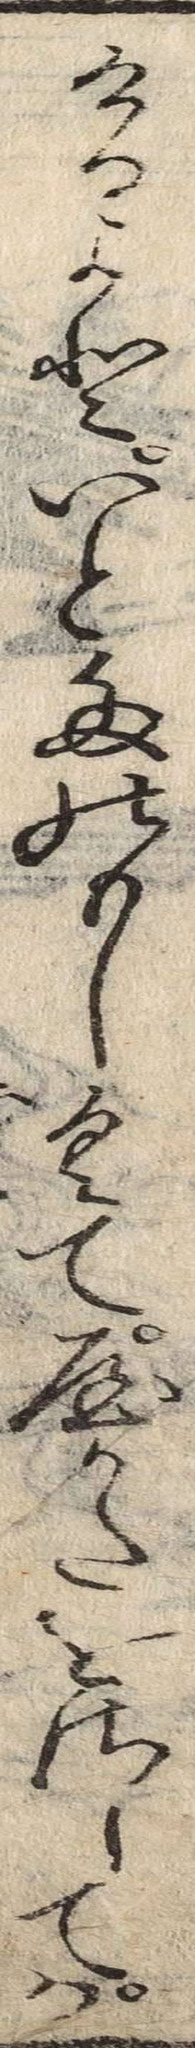けるよと。いとたのもしくて。屋かたをさして。か
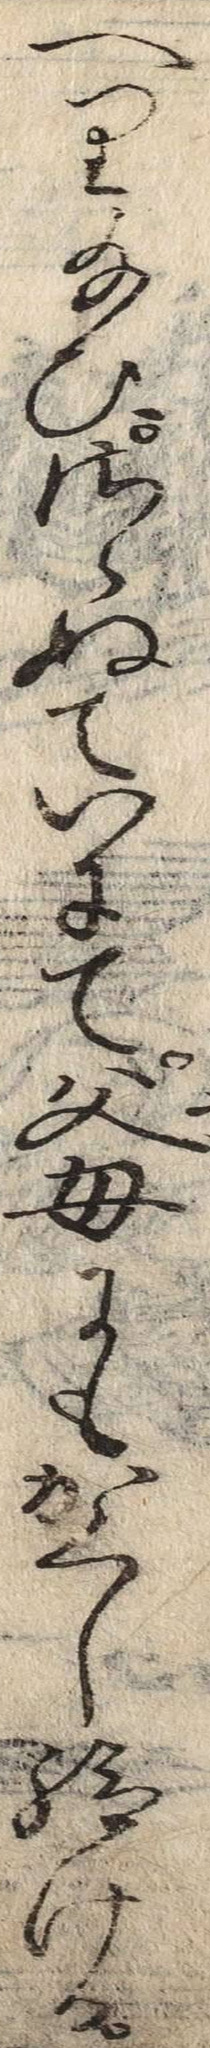へり給ひ。さらぬていにて。父母にもかくし給ける。
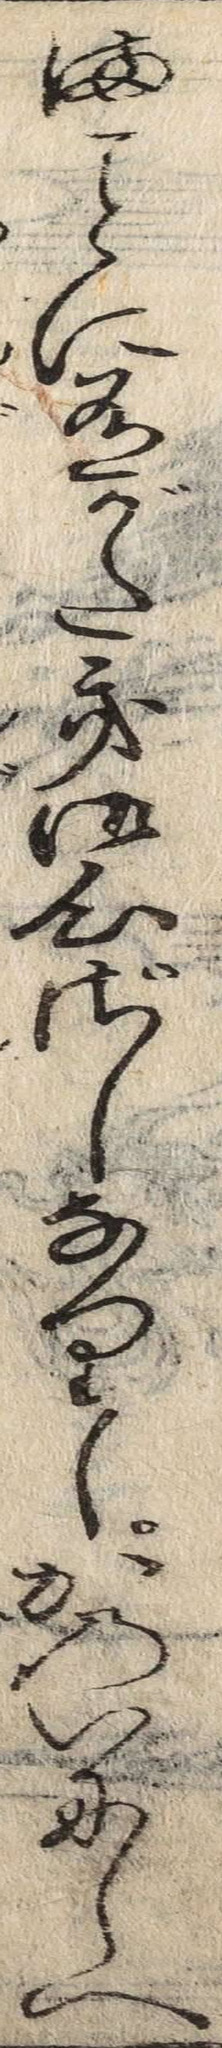まことに有がたき御心ざしなりし。かのいにしへ
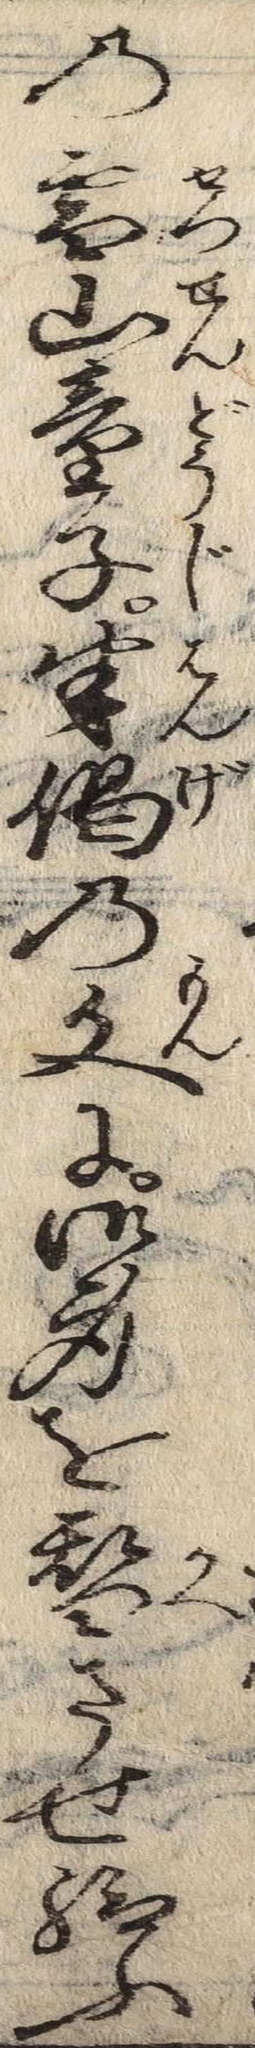の雪山童子半偈の文に。御身を替させ給ふ
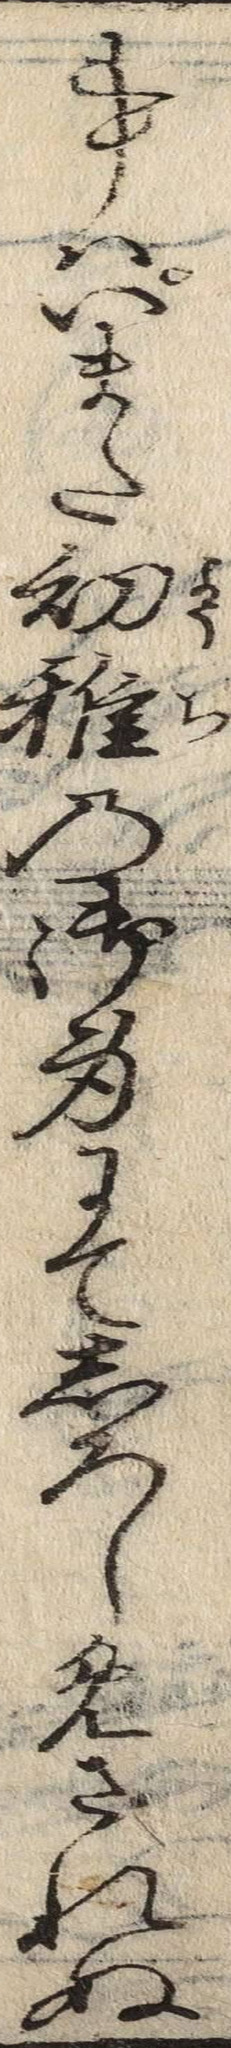事は。いまた幼稚の御身にてしろしめされぬ
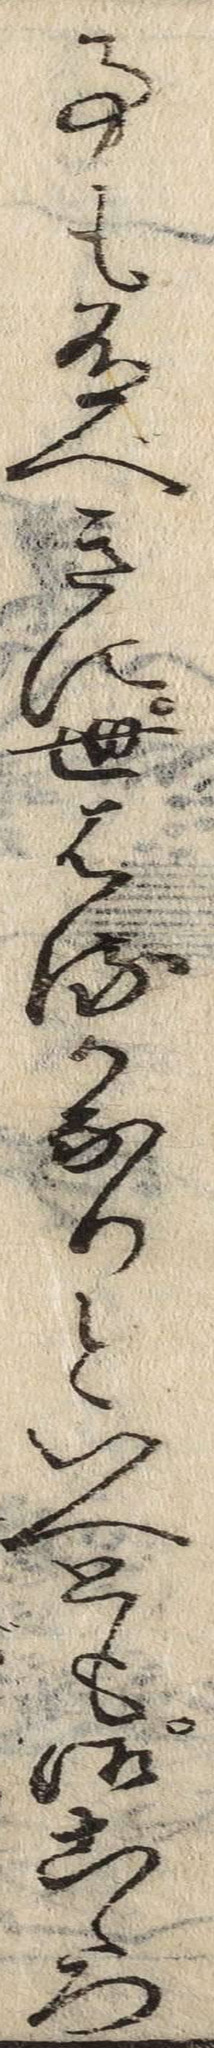事も有べきに。世はるかなりといへども。御こゝろ
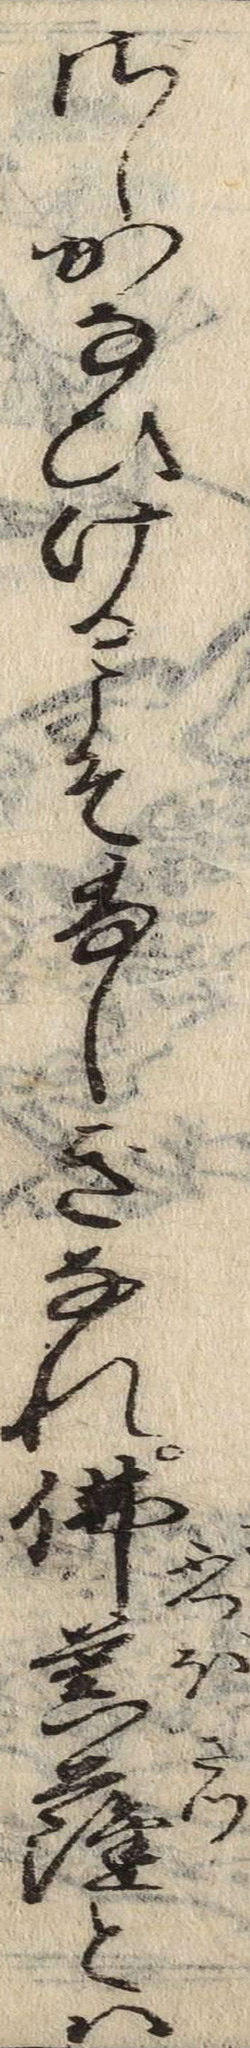ざしかなひけるこそふしぎなれ。仏菩薩とは
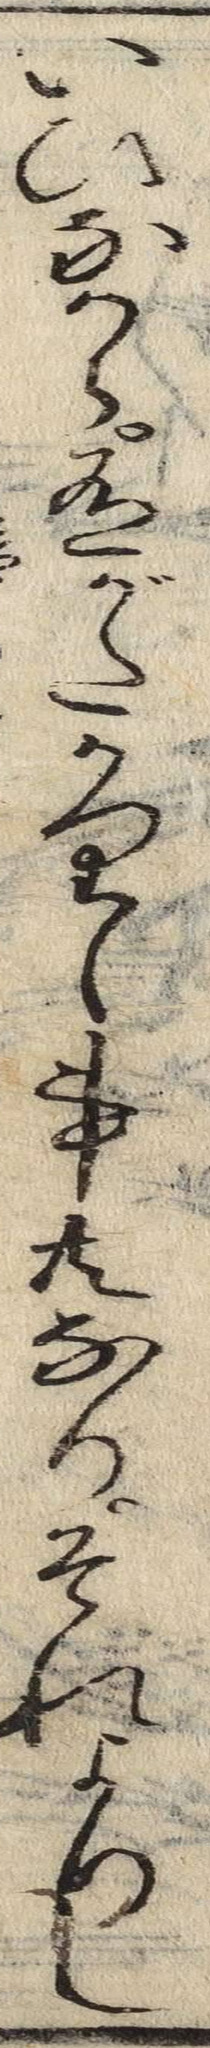いひなから。有がたかりし事共なり。それよりし
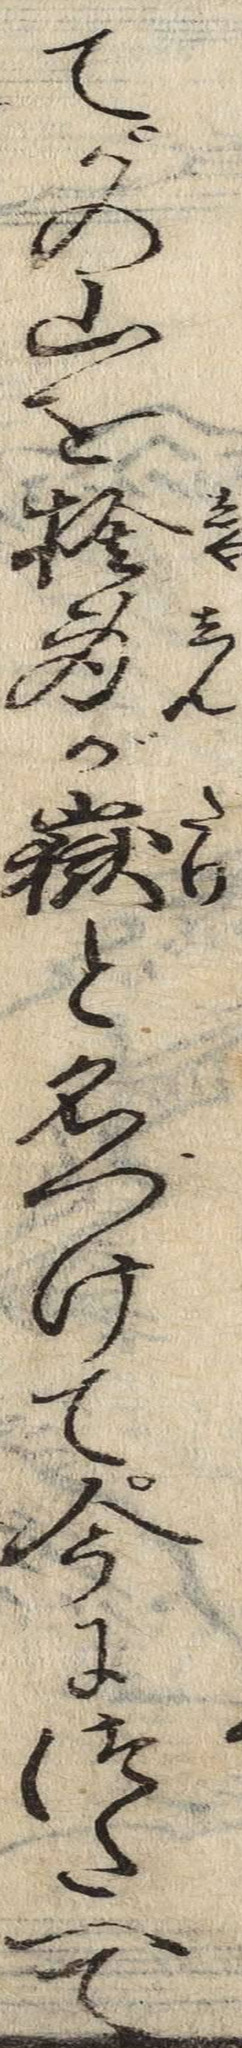て。かの山を捨身か嶽と名づけて。今につたへて
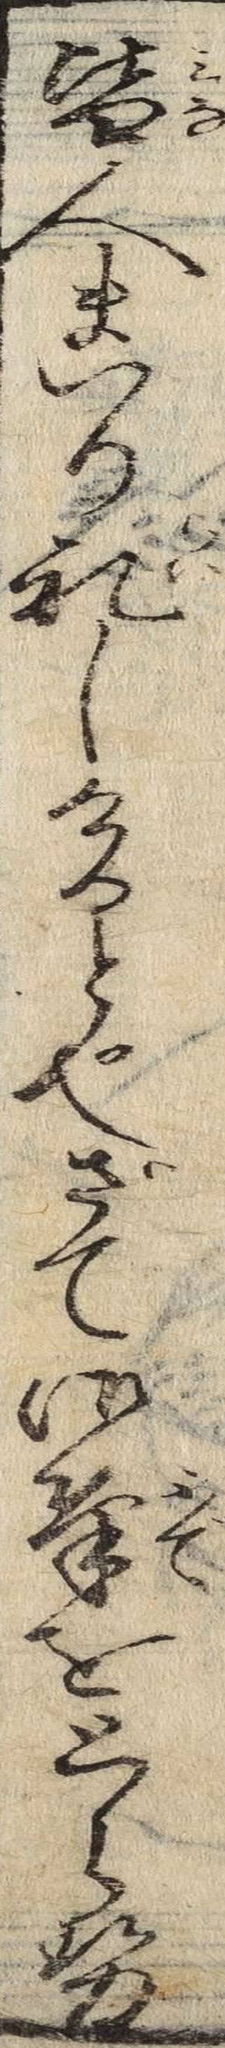皆人まいり礼しけるとぞ。さて御筆をとらせ
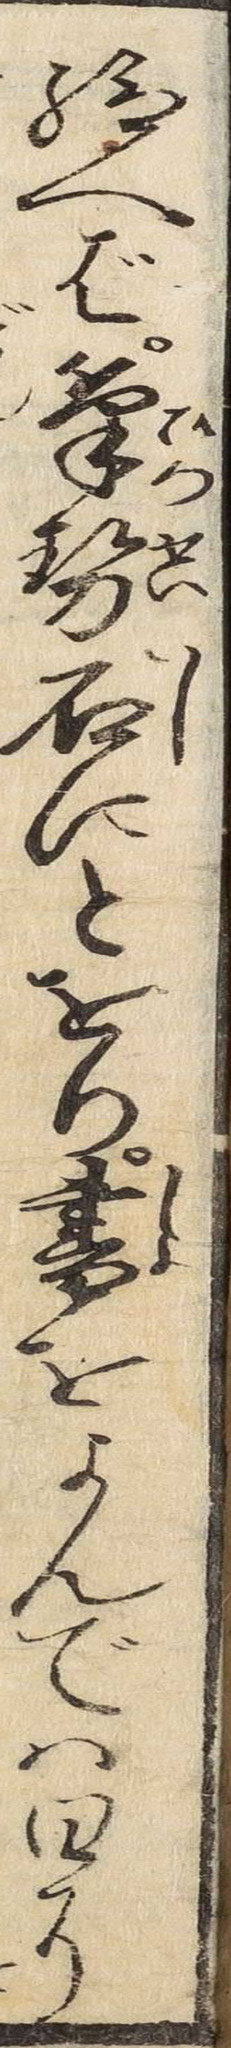給へば。筆勢石にとをり書をよんでは日に
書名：弘法大師御傳記
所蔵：京都府立京都学・歴彩館 国文学研究資料館
